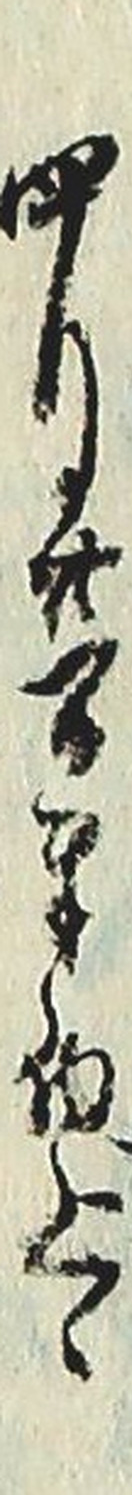四月廿一日奉拝上候
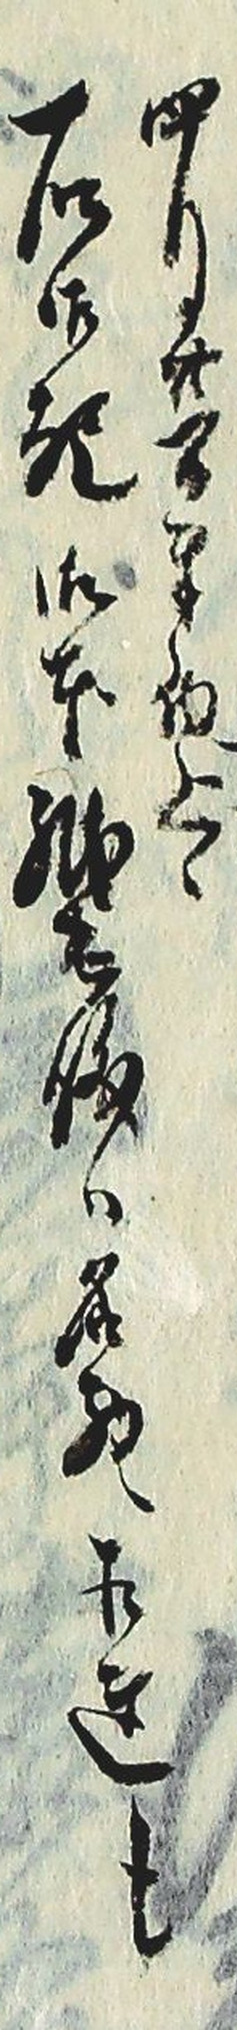右御配御本紙之儀は名西へ相達申候
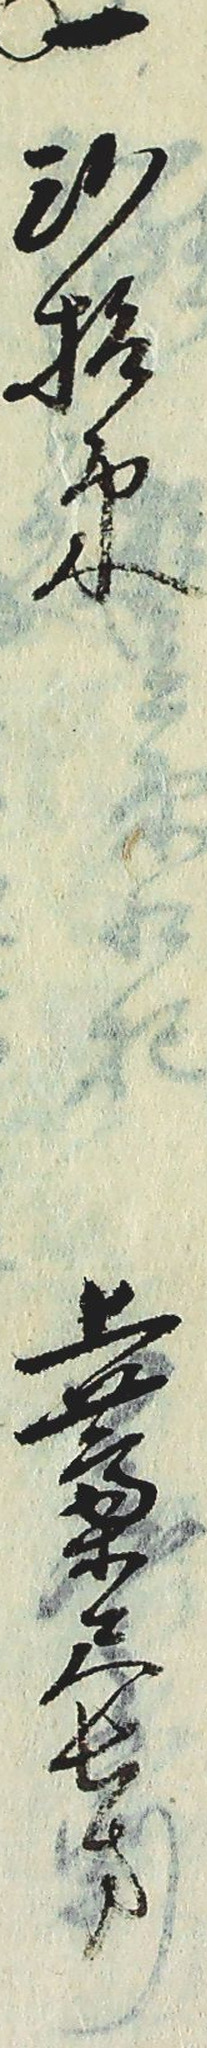一弐拾束上藁尺長方
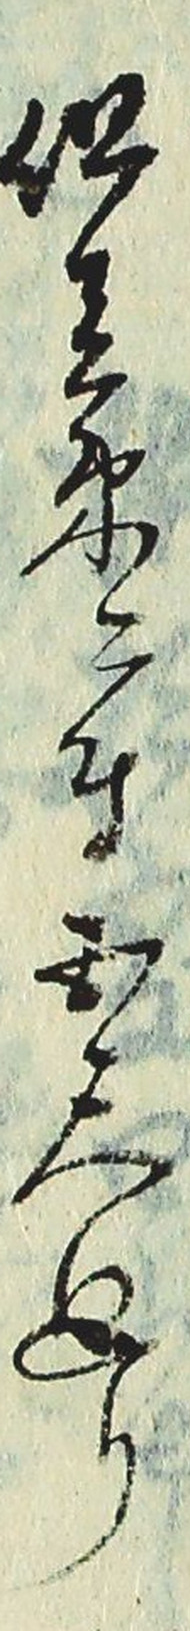但壱束に付五尺廻り
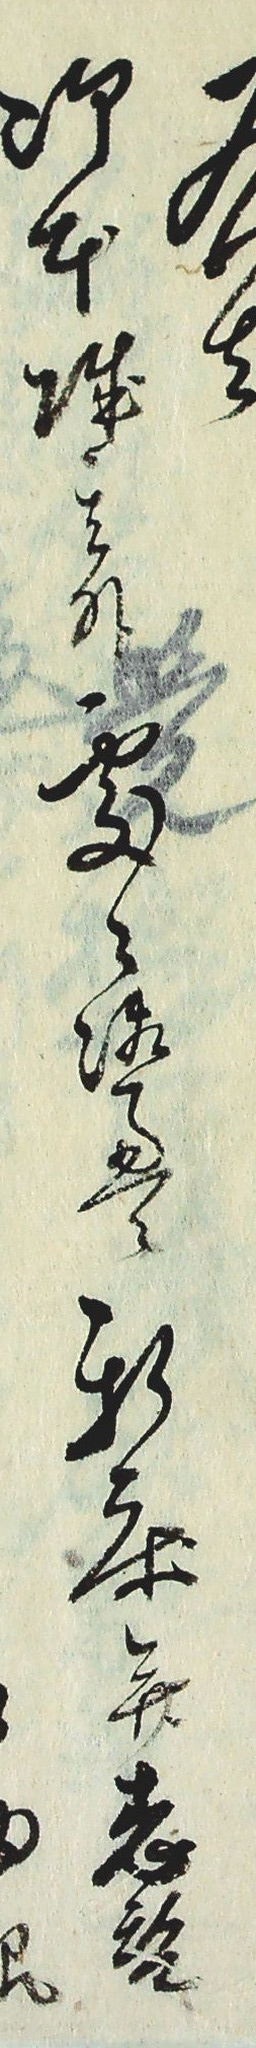御本城其外処々御畳新床并表替
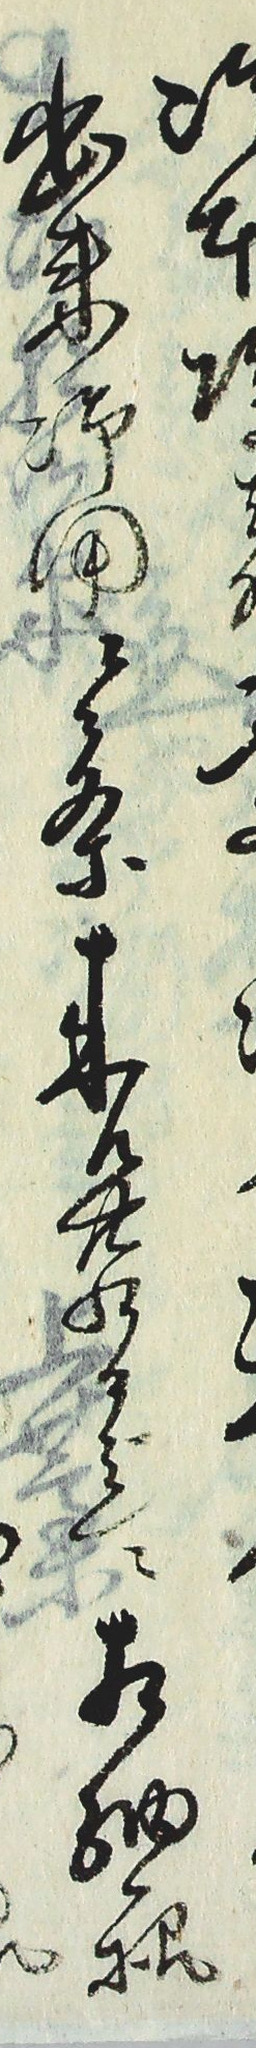出来御用に候条来る廿九日迄に相納候様
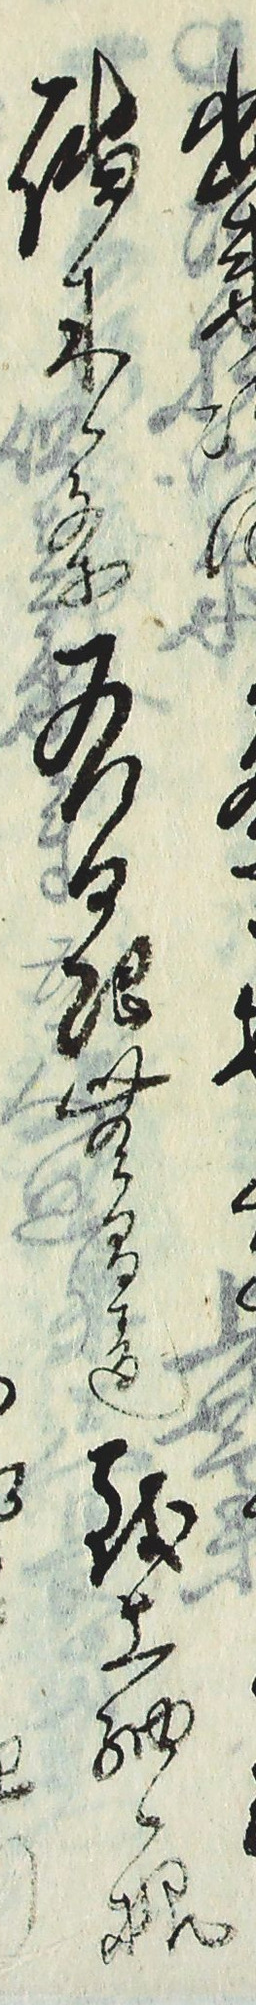誂来候条右日限無間違致上納候様
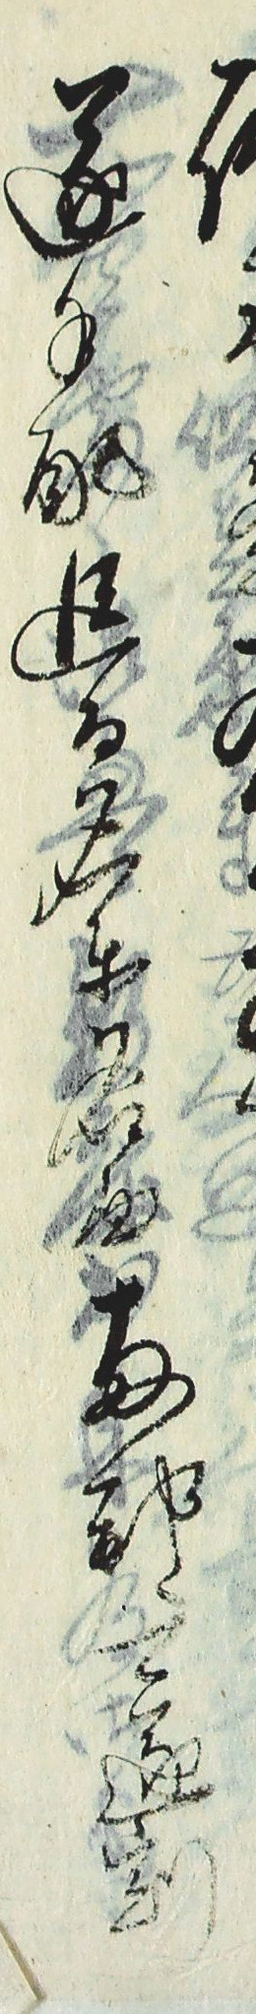遂手配追て名東名西両郡へ可遂割

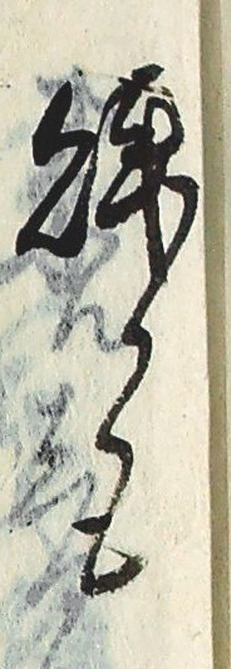賦候以上
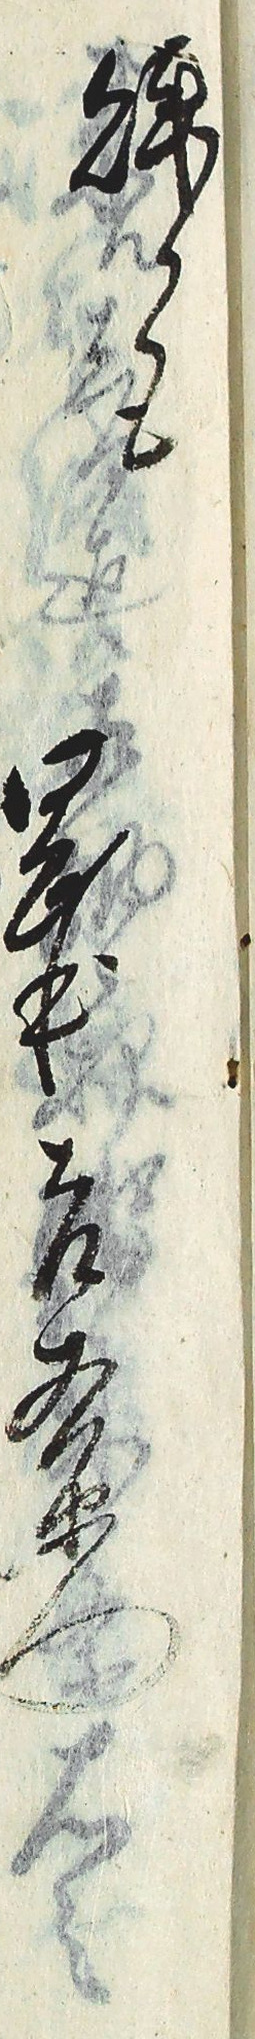岡本吉右衛門
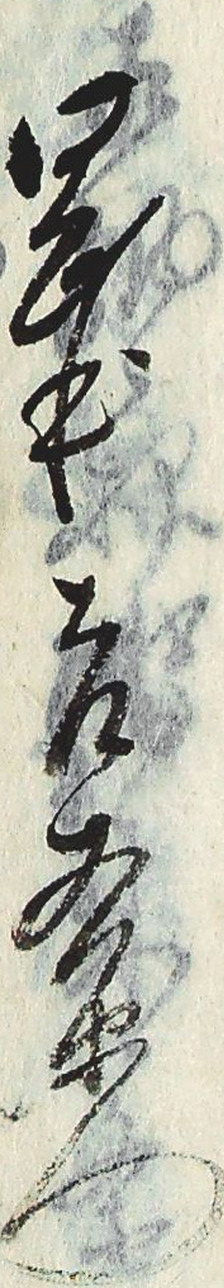岡本吉右衛門
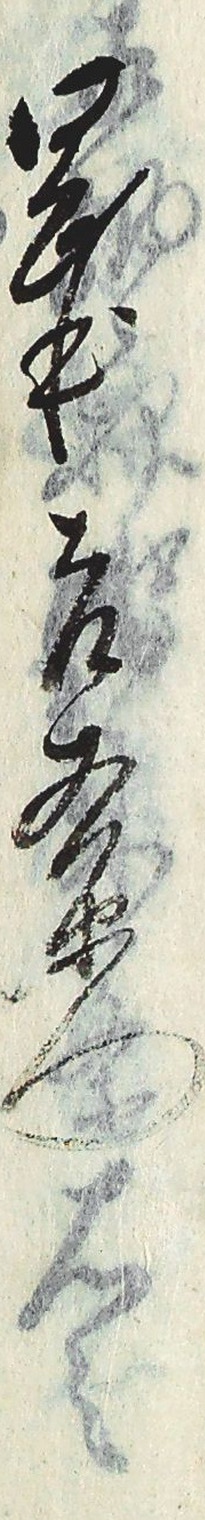岡本吉右衛門
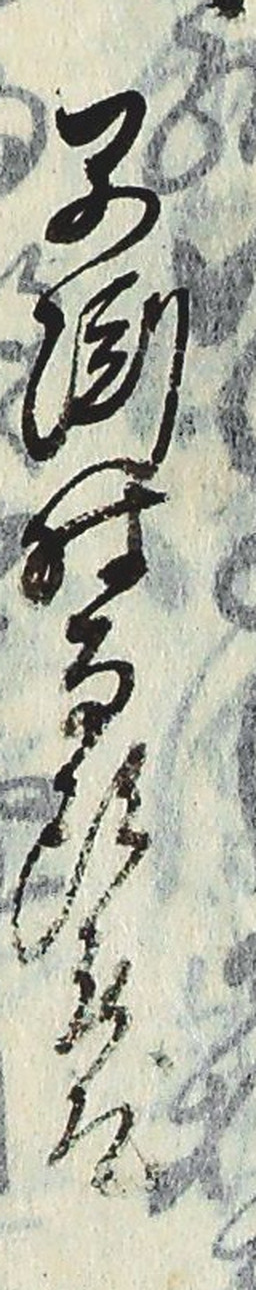早淵村与頭庄屋
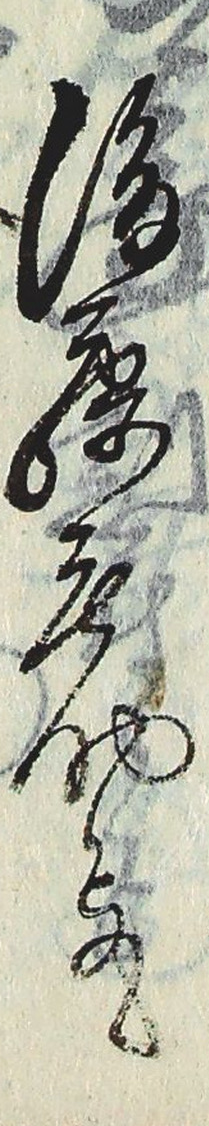後藤庄助方へ
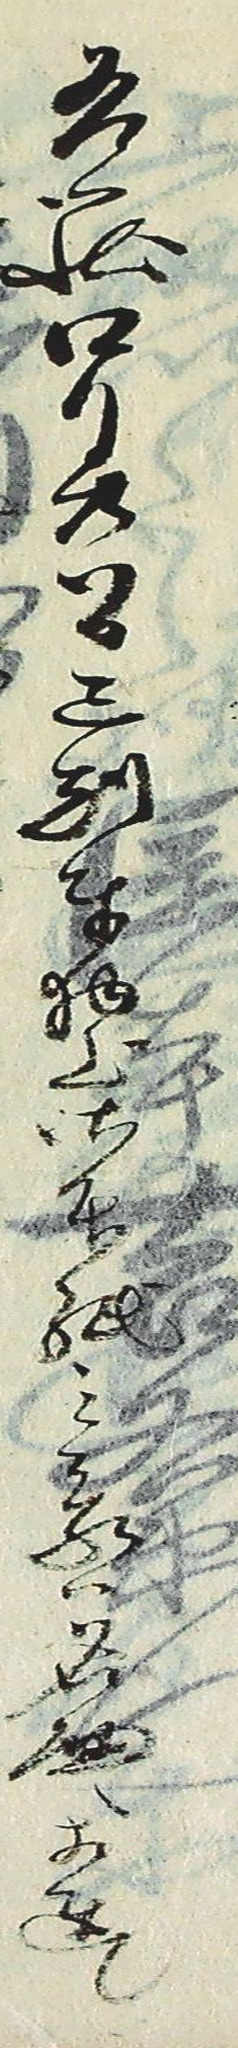右御状四月廿八日巳刻奉拝上御本紙之義は名西へ相達候
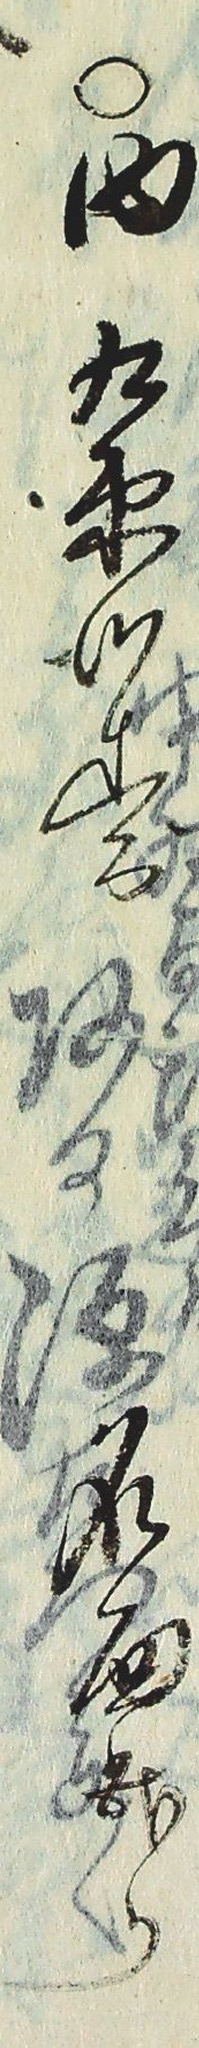内九束弐歩名西当り
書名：名東郡中諸割賦元帳
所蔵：鳴門教育大学 Naruto University of Education
